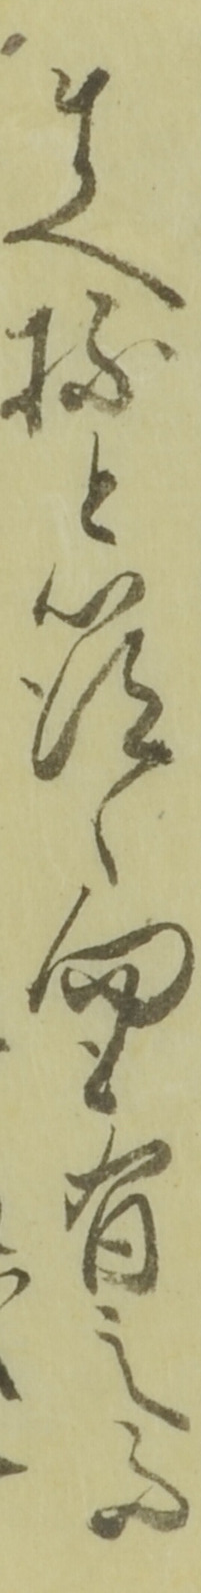まへ等と心得候向も有之不
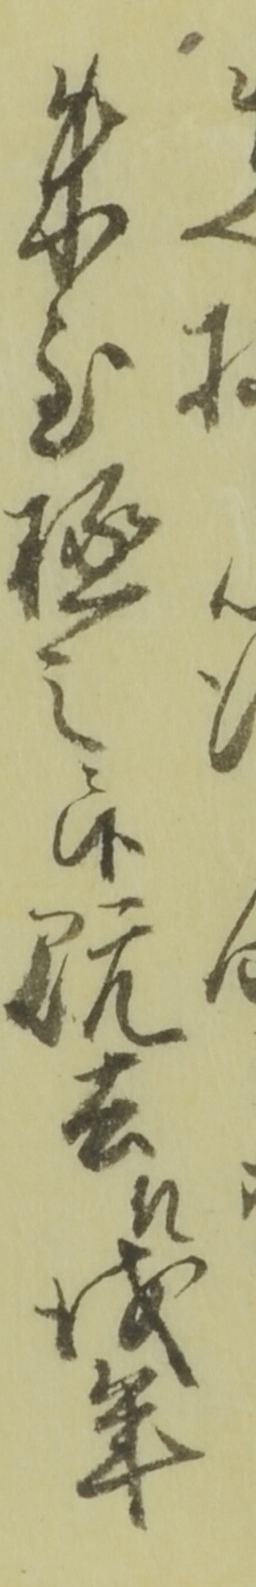束至極之ニ候既去ル戌年
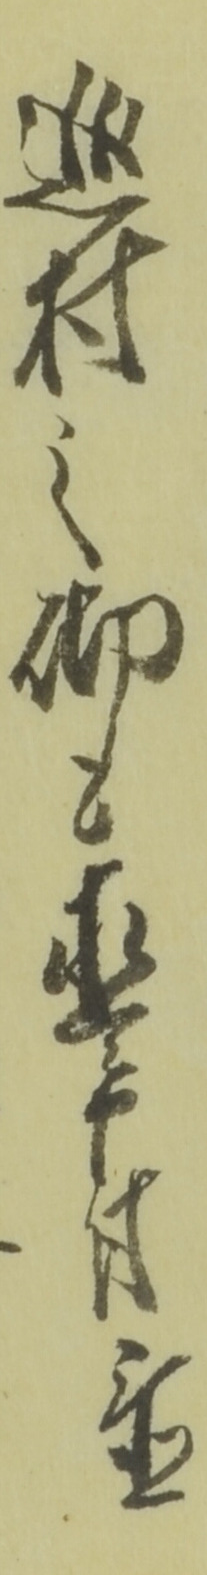巡村之砌も直ニ申付置
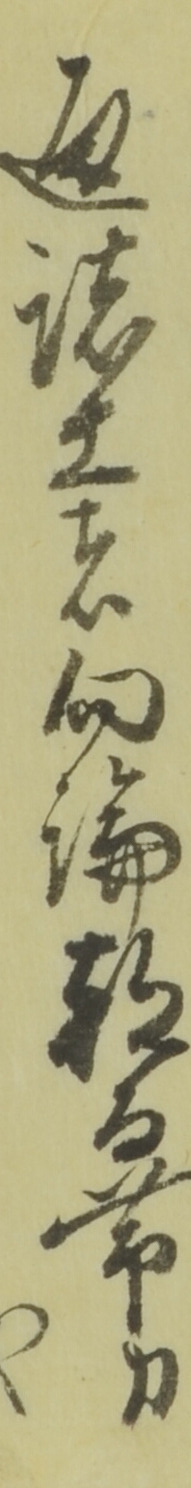通諸士は勿論都而帯刀
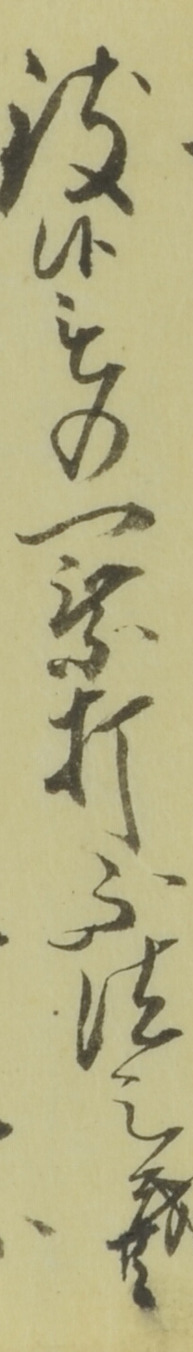致候もの一乗打不法之義
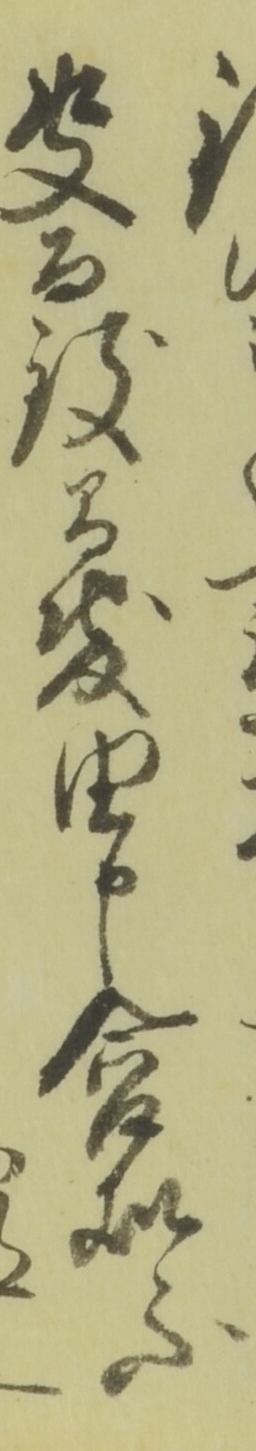決而致間敷由申含処不
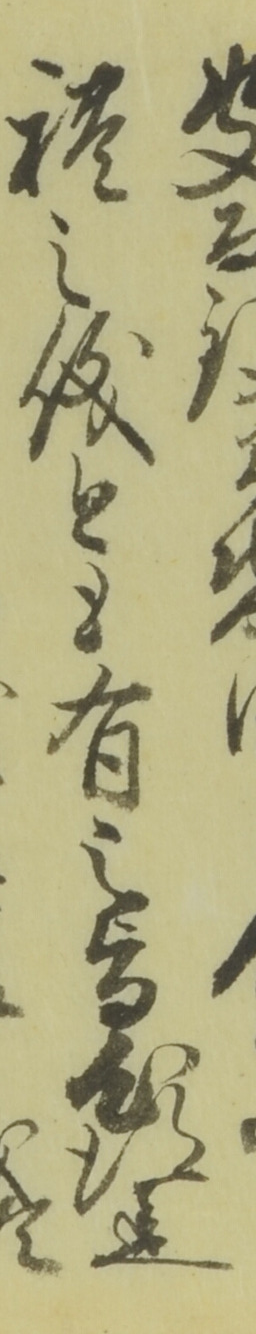礼之儀とも有之旨心得違
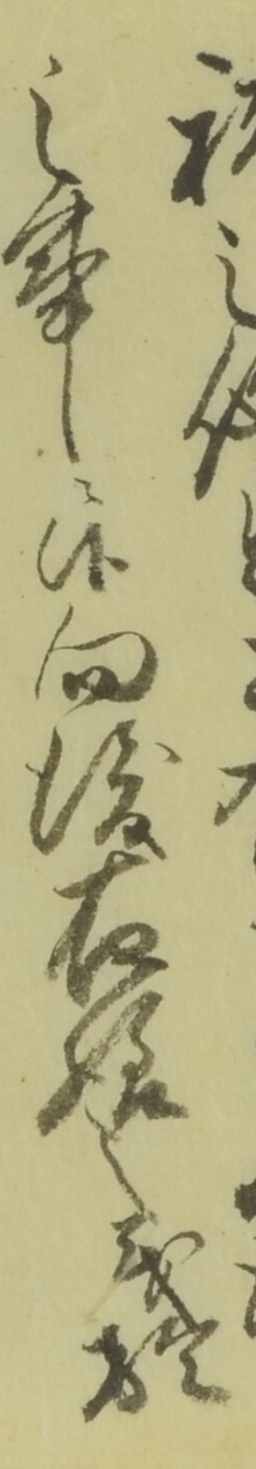之事ニ候向後右様之義於
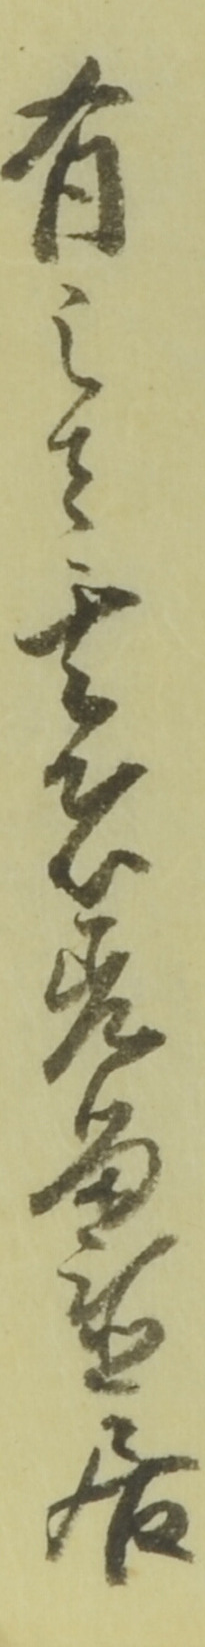有之は其意差留置居

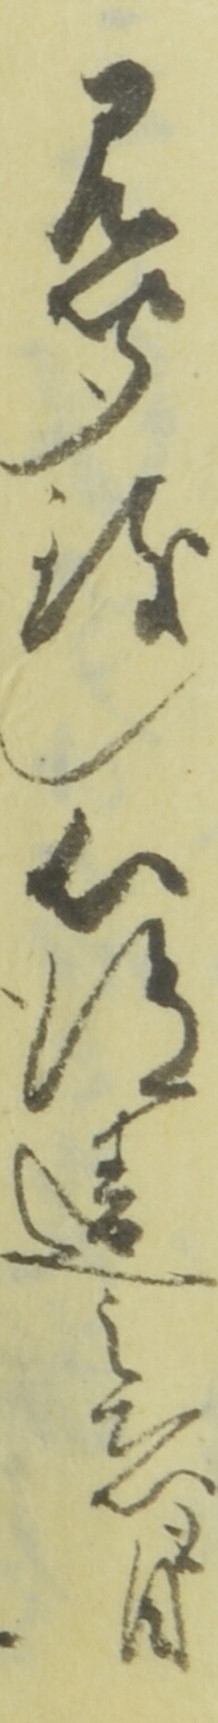見聞致し心得違之者も自
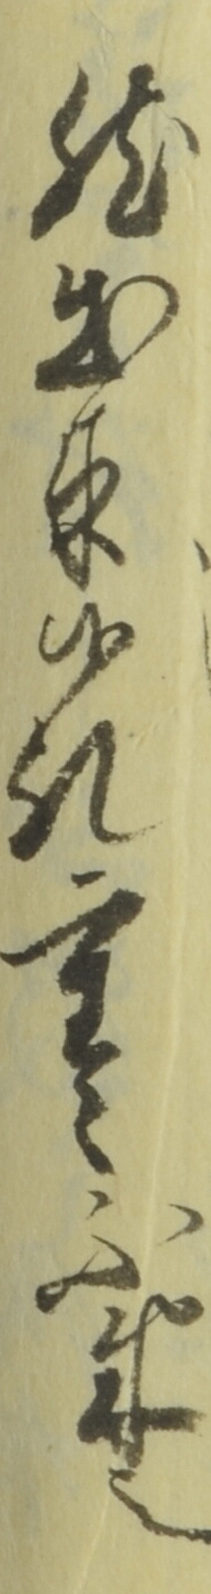然出来候欤重々不束之
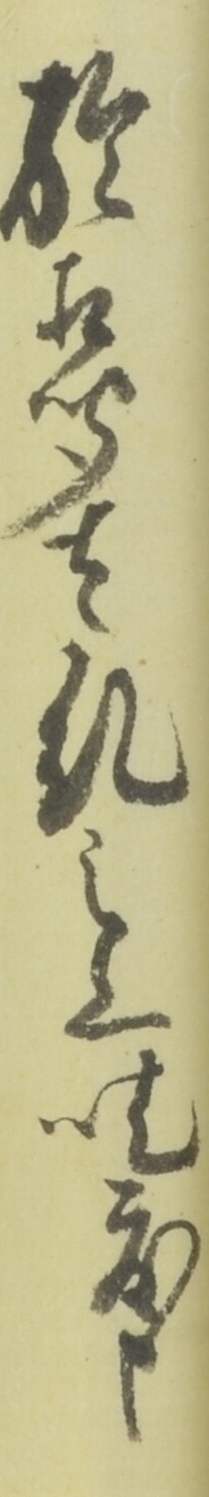於相聞を糺之上屹度申
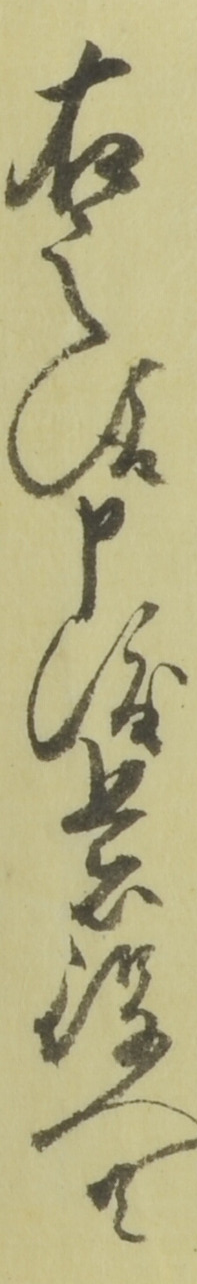右之趣申渡候は役人共
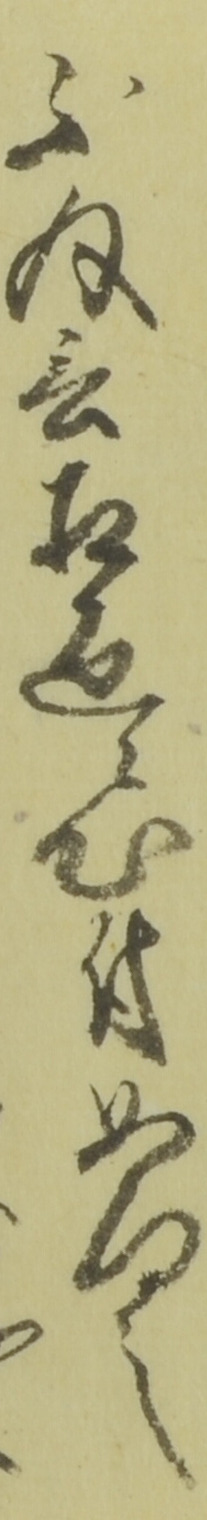不為言相廻ニ心付如何之
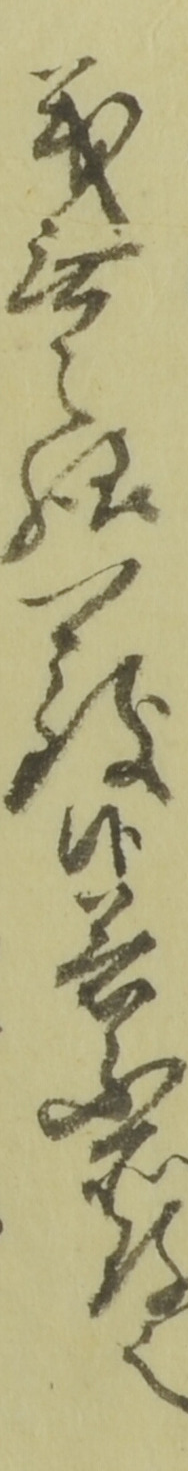義無之様可致候不所存之
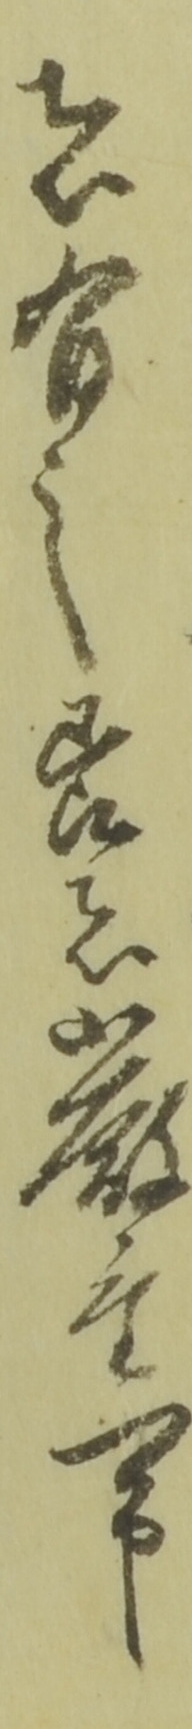者有之節は厳重可申
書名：御触書御書附控
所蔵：伊那市立高遠町図書館・合同会社AMANE
